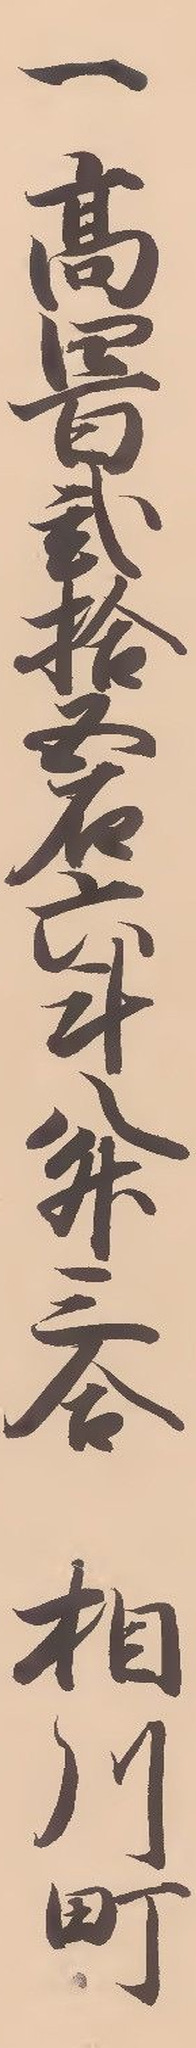一高四百弐拾五石六斗八升三合相川町
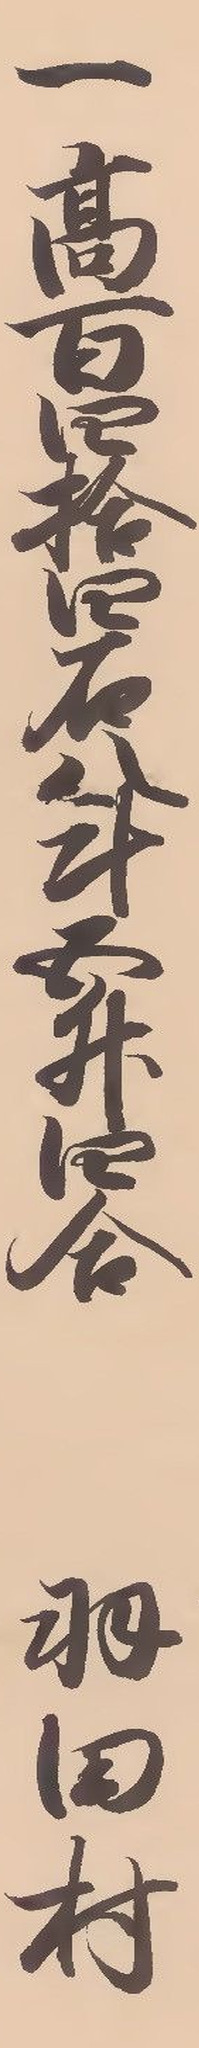一高百四拾四石八斗五升四合羽田村
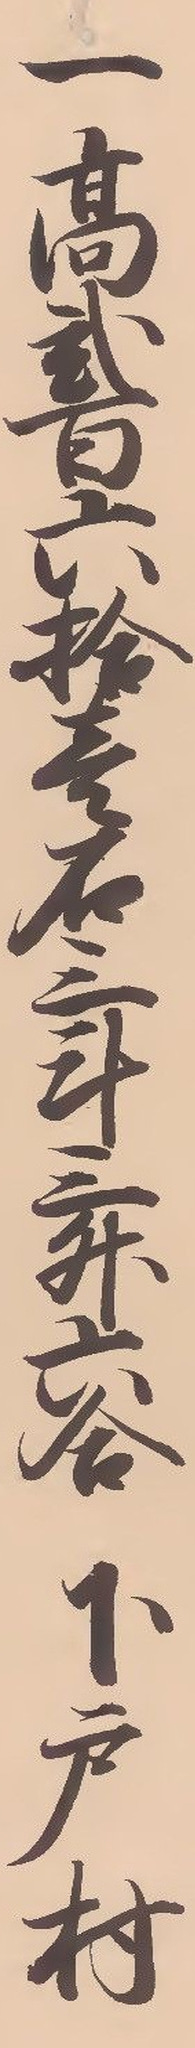一高弐百六拾壱石三斗三升六合下戸村
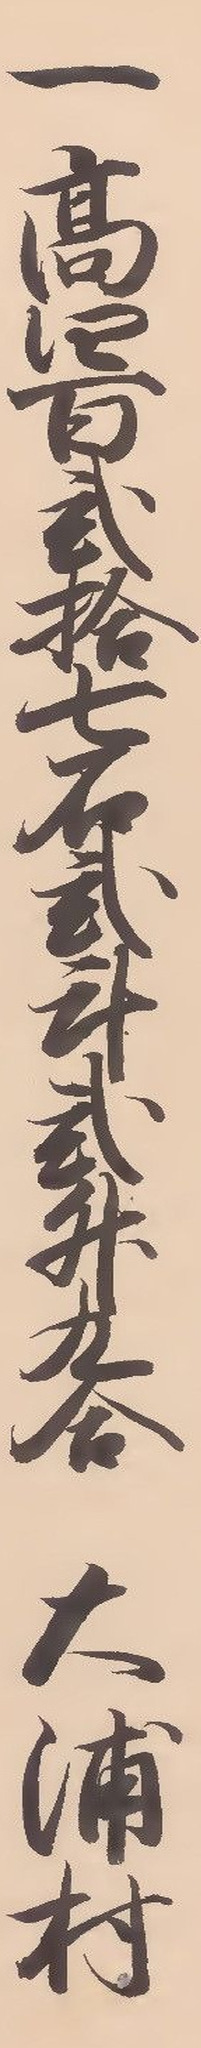一高四百弐拾七石弐斗弐升九合大浦村
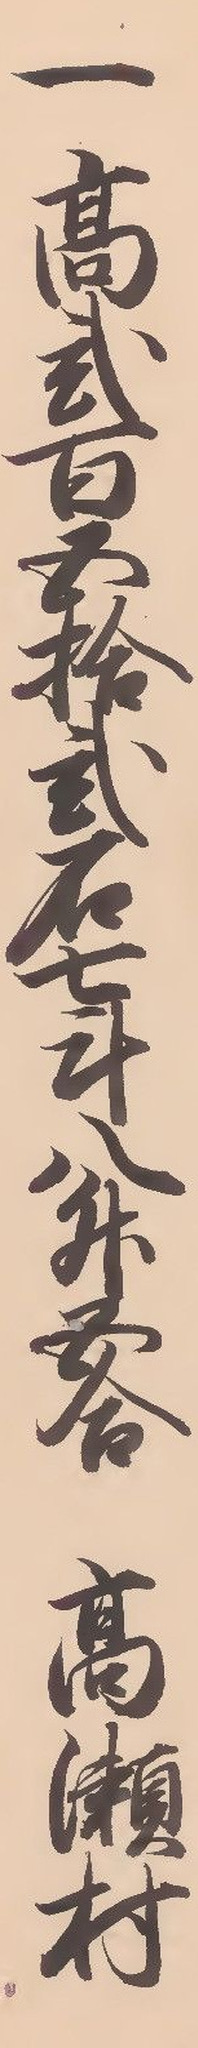一高弐百五拾弐石七斗八升五合高瀬村

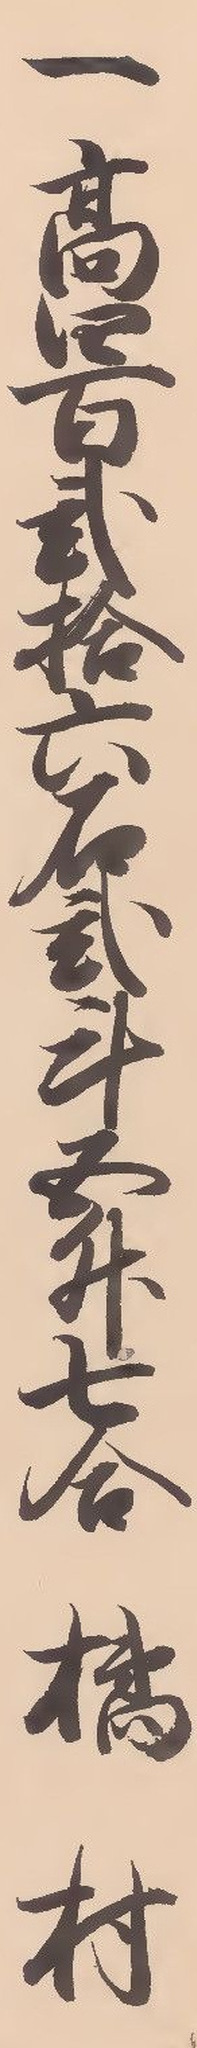一高四百弐拾六石弐斗五升七合橘村
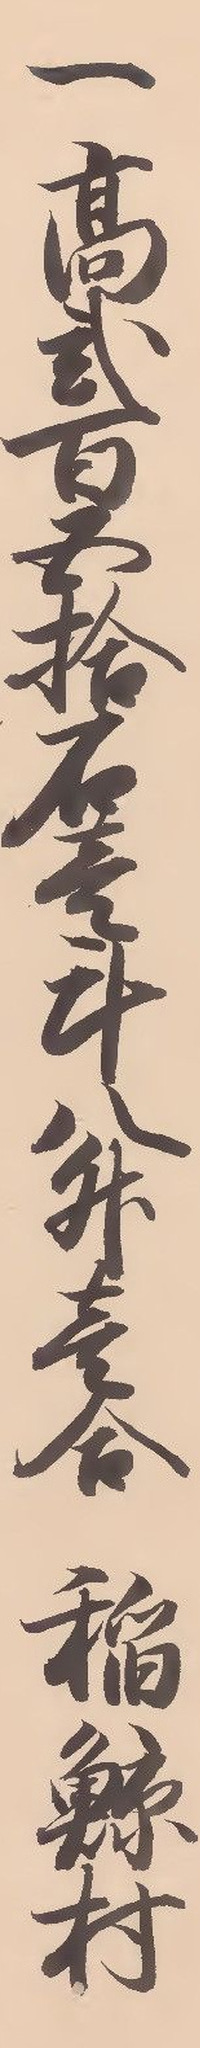一高弐百五拾石壱斗八升壱合稲鯨村
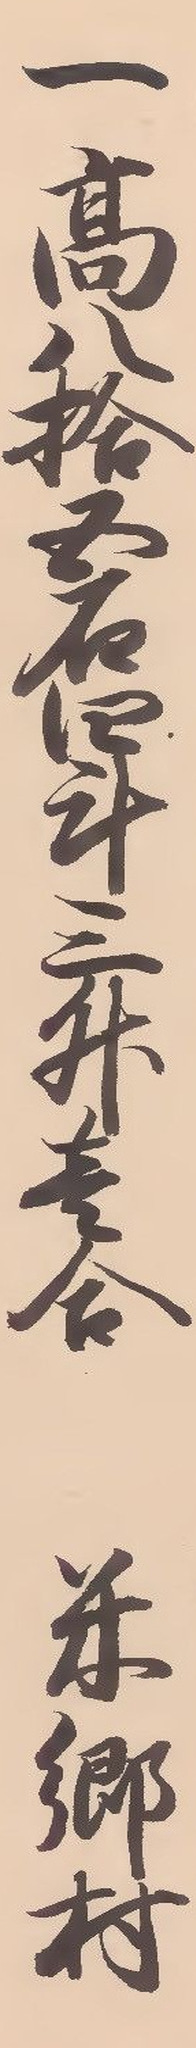一高八拾五石四斗三升壱合米郷村
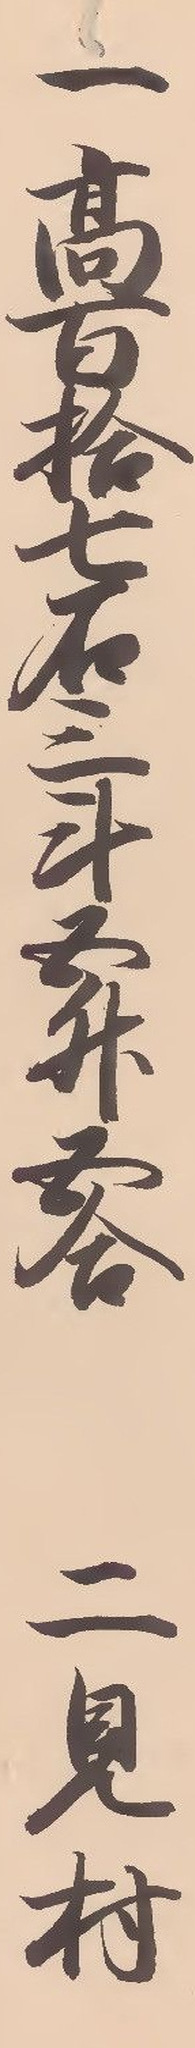一高百拾七石三斗五升五合二見村
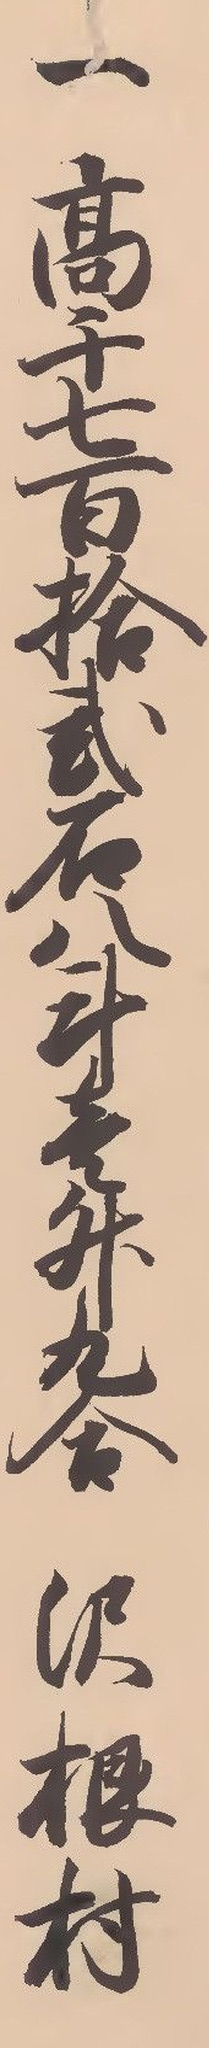一高千七百拾弐石八斗壱升九合沢根村
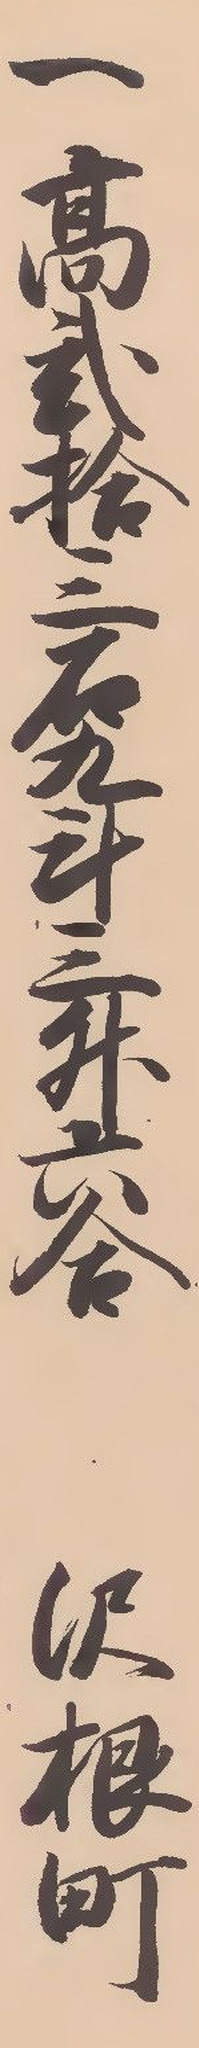一高弐拾三石九斗三升六合沢根町
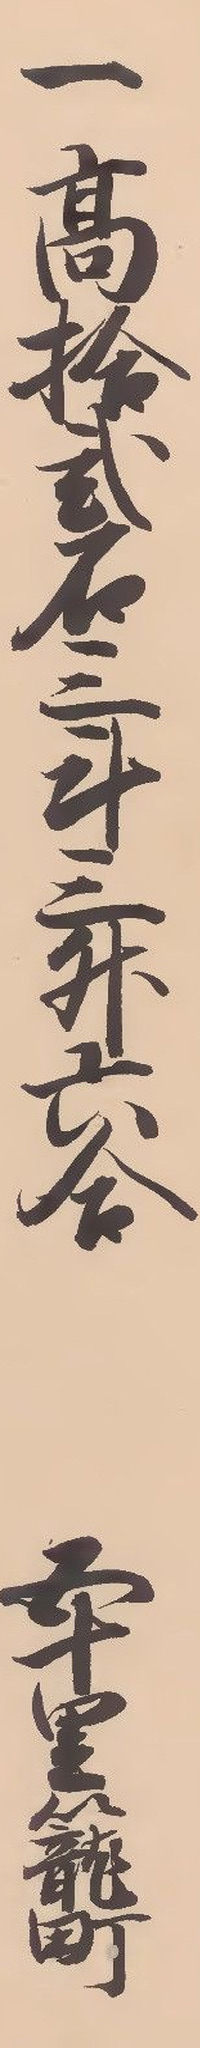一高拾弐石三斗三升六合五十里籠町
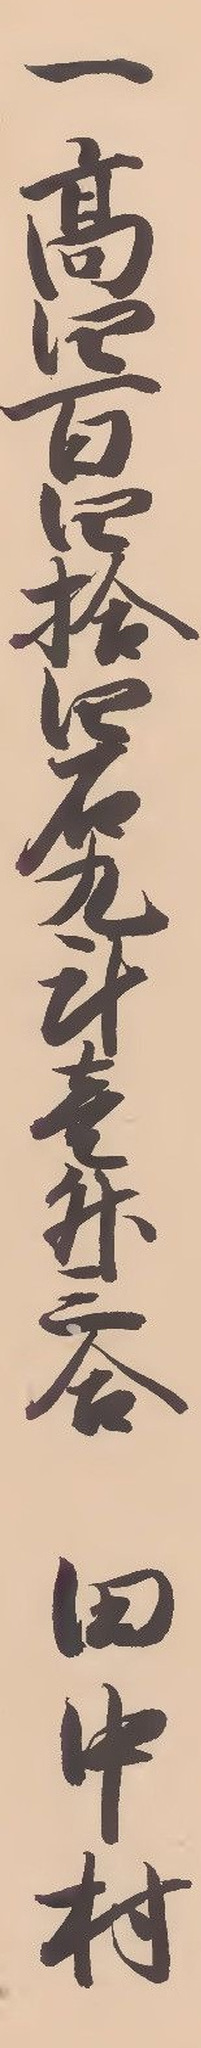一高四百四拾四石九斗壱升三合田中村

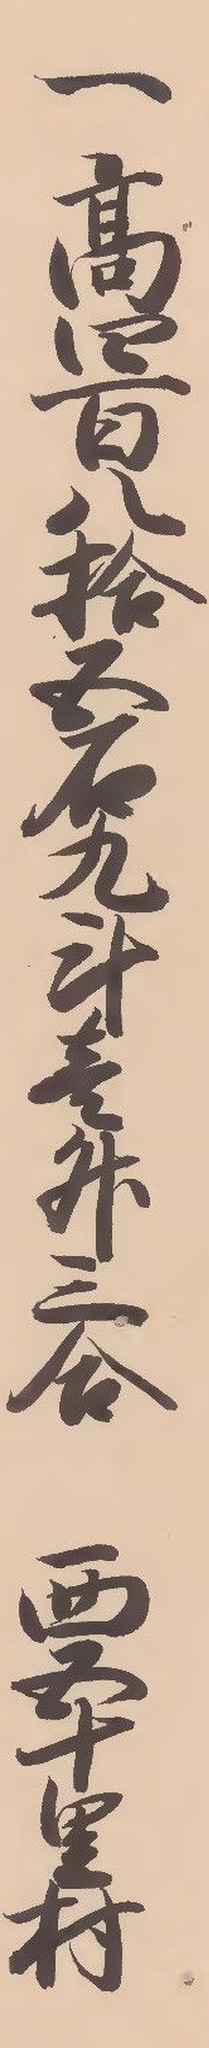一高四百八拾五石九斗壱升三合西五十里村
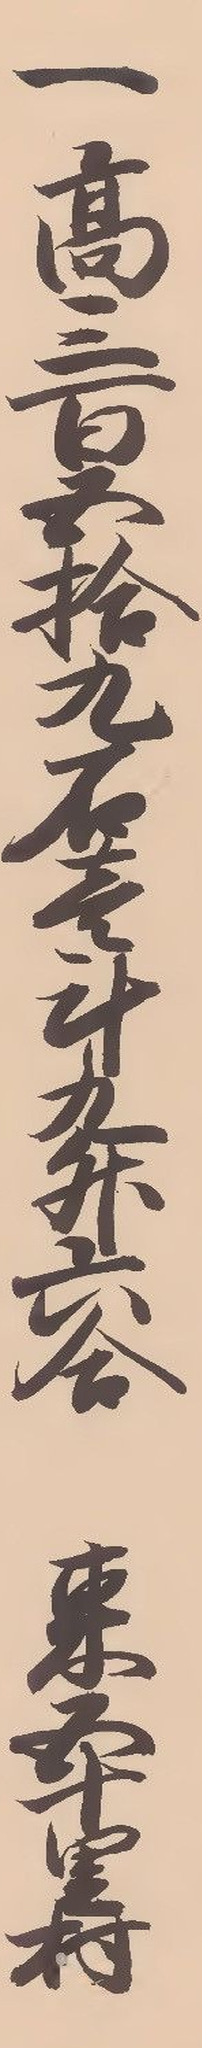一高三百五拾九石壱斗九升六合東五十里村
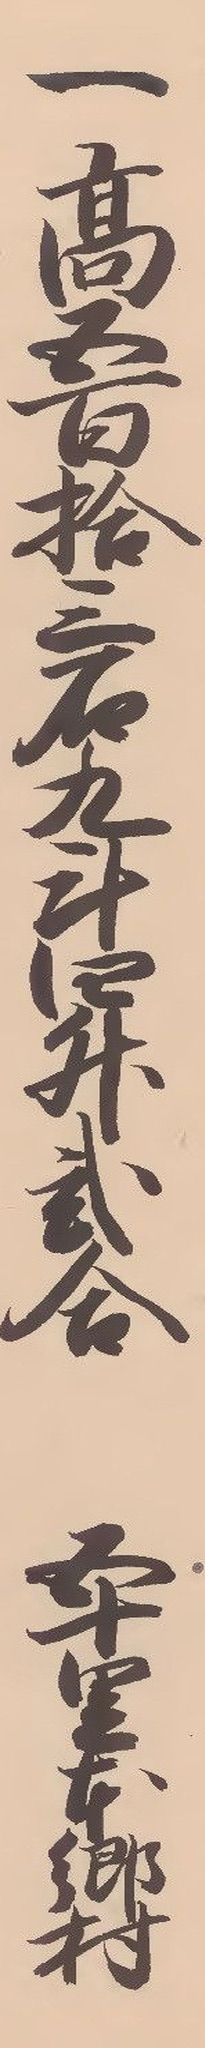一高五百拾三石九斗四升弐合五十里本郷村
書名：佐渡国郷帳
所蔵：国立公文書館 National Archives of Japan
